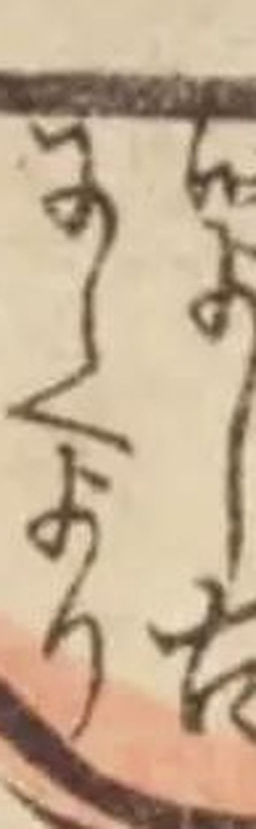にしへより
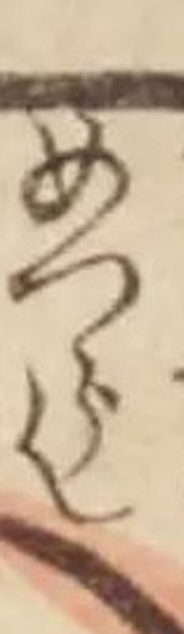めつらし
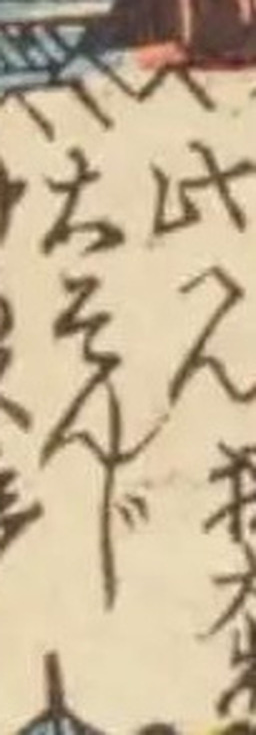大そんじ
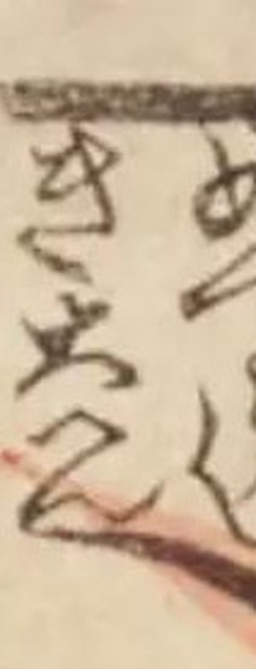き大へん
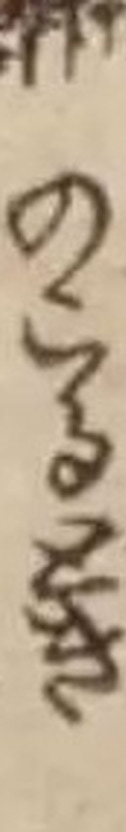のこるとき
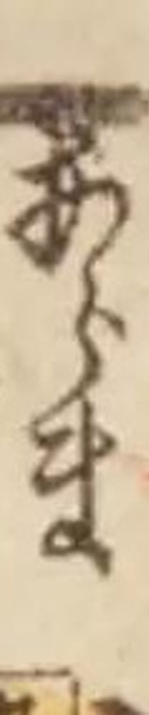あらま
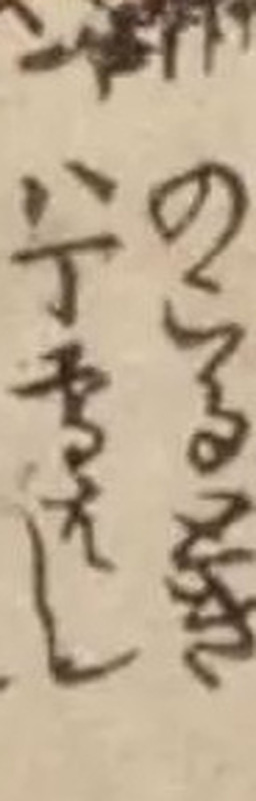八丁鳥はし
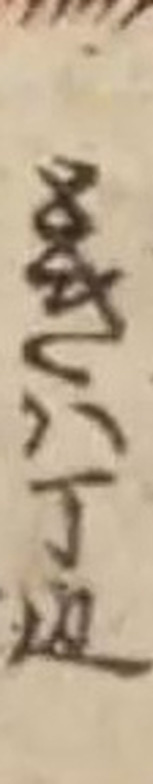ときは丁辺
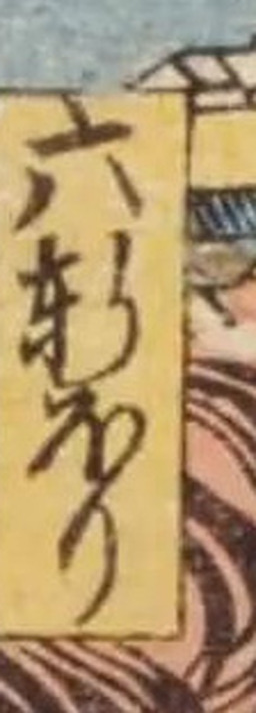六軒ほり
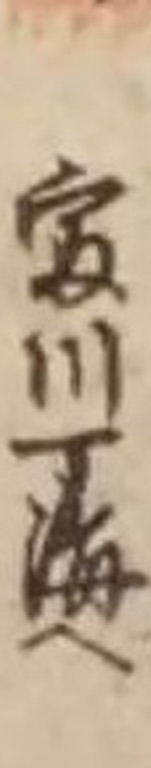富川丁海へ
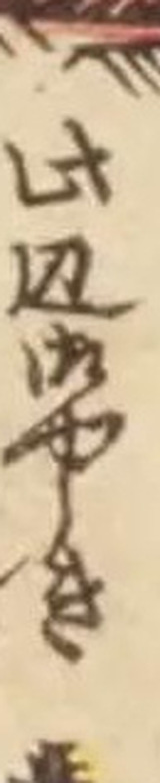此辺御やしき
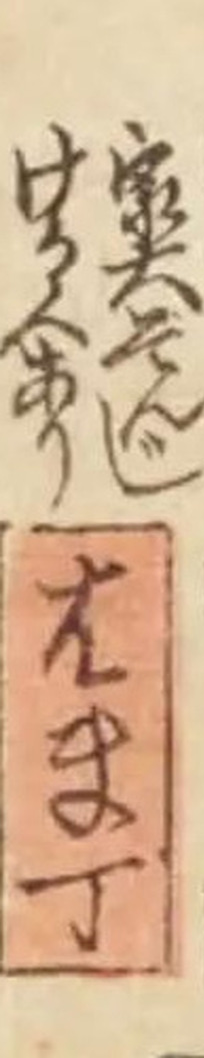けか人あり
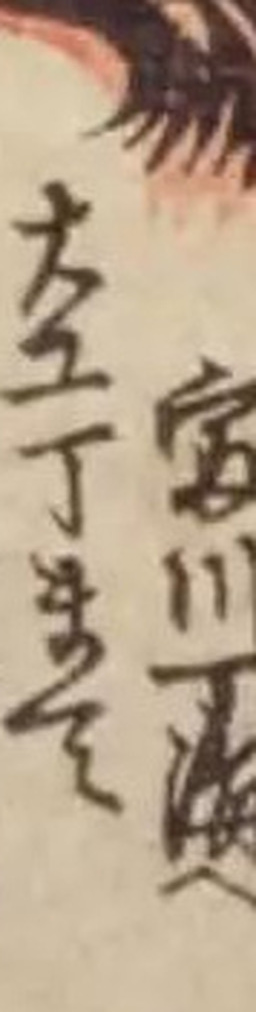大工丁まて
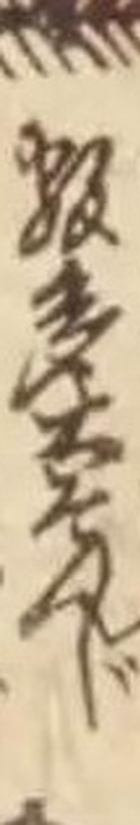数多く大そんじ
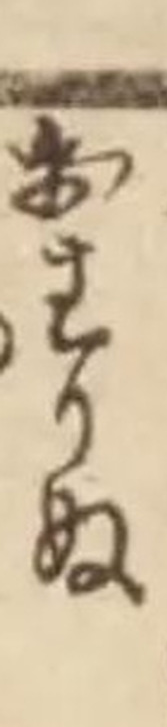おわりぬ
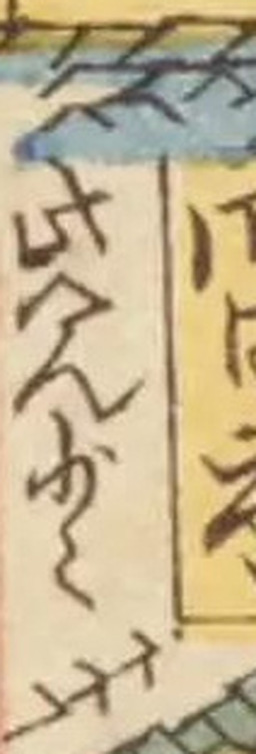此へん少々
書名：銘細改板江戸大地震出火場所附
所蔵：国立国会図書館 National Diet Library, JAPAN
